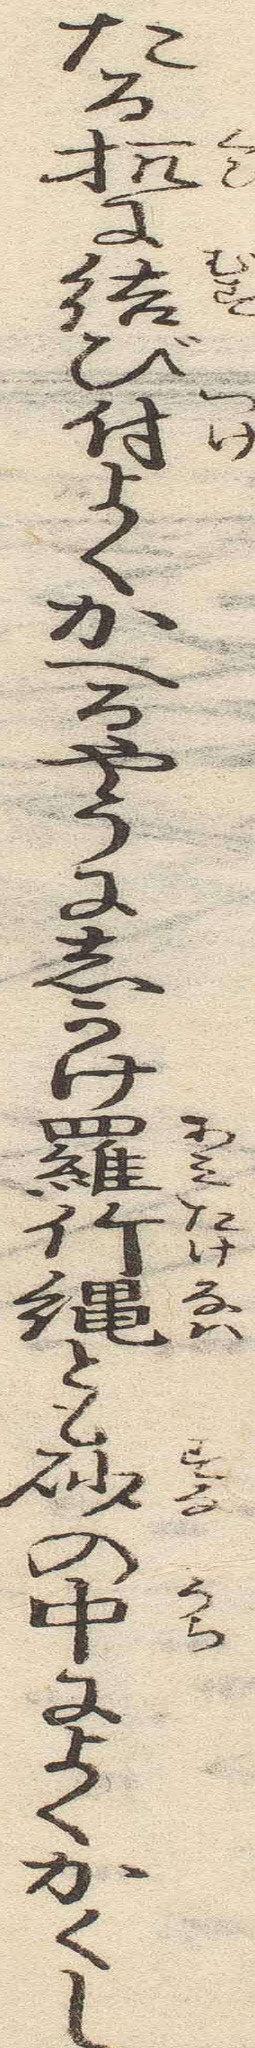たる杭に結び付よくかへるやうにしかけ羅竹縄とも砂の中によくかくし
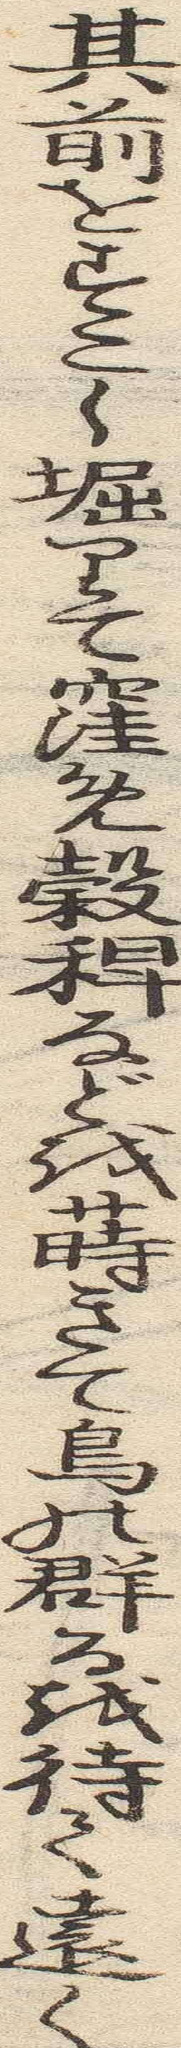其前をすこし掘りて窪め穀稗などを蒔きて鳥の群るを待て遠く
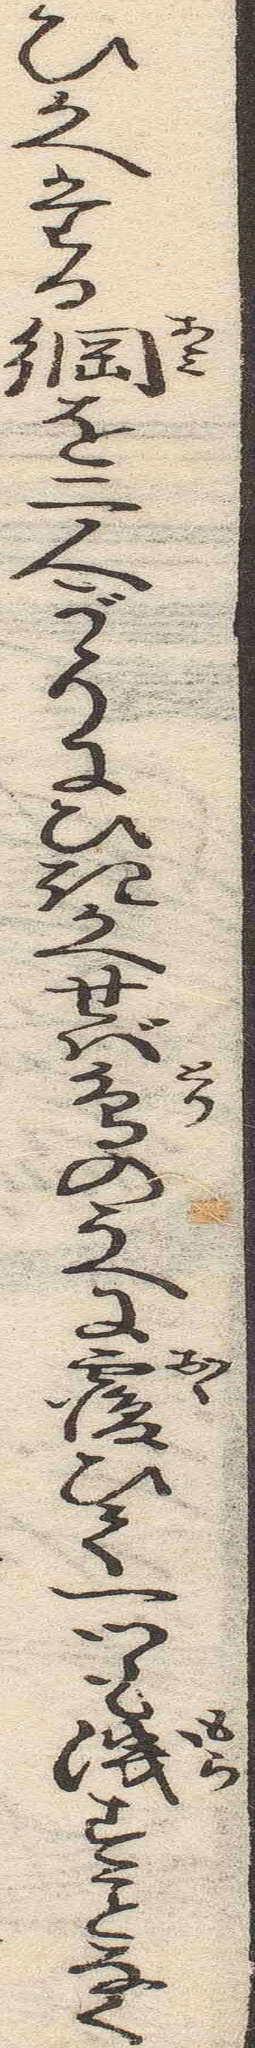ひかへたる網を二人がゝりにひきかへせば鳥のうへに覆ひて一つも洩すことなく
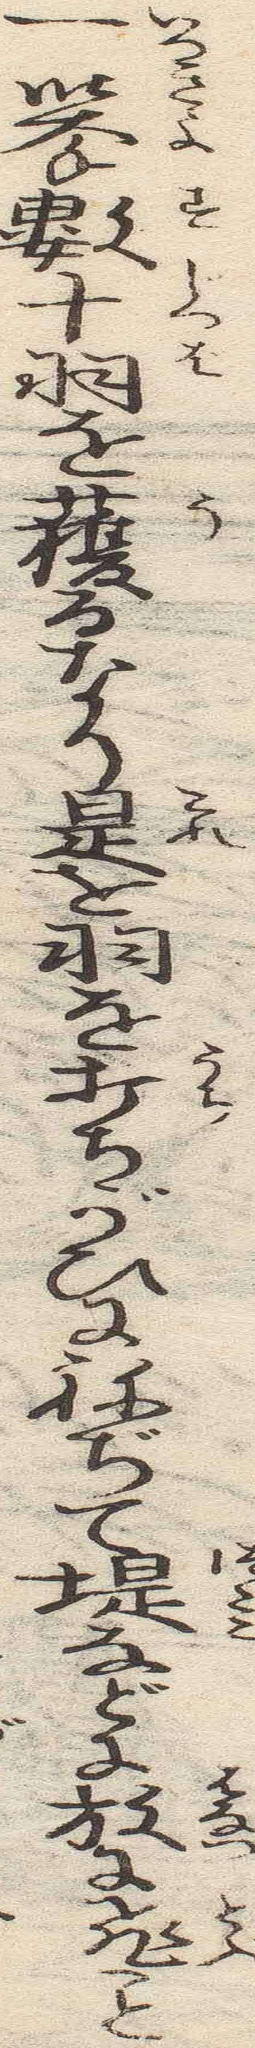一挙数十羽を獲るなり是を羽を打ちがひにねぢて堤などに放に飛こと
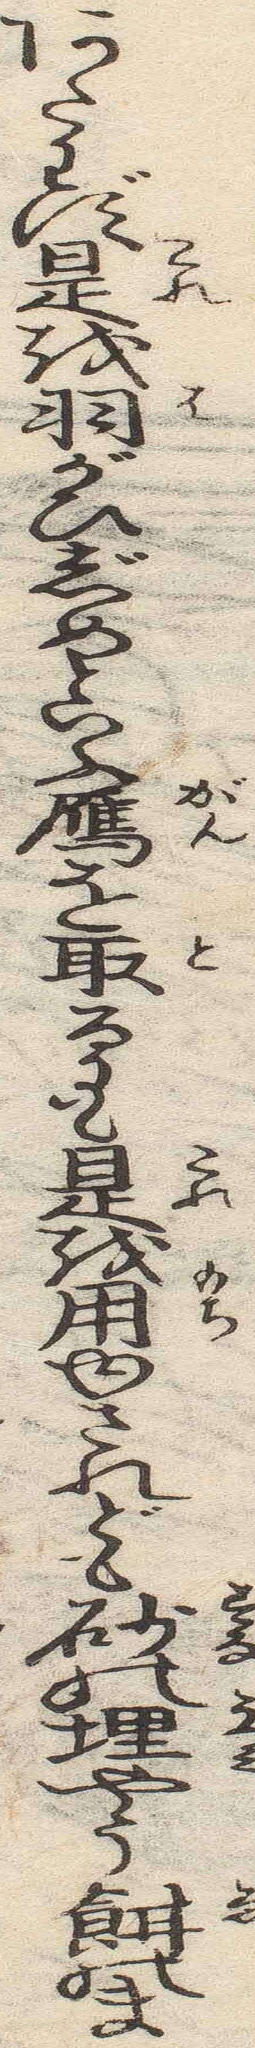あたわず是を羽がひじめといふ雁を取るにも是を用ゆされども砂の埋やう餌のま
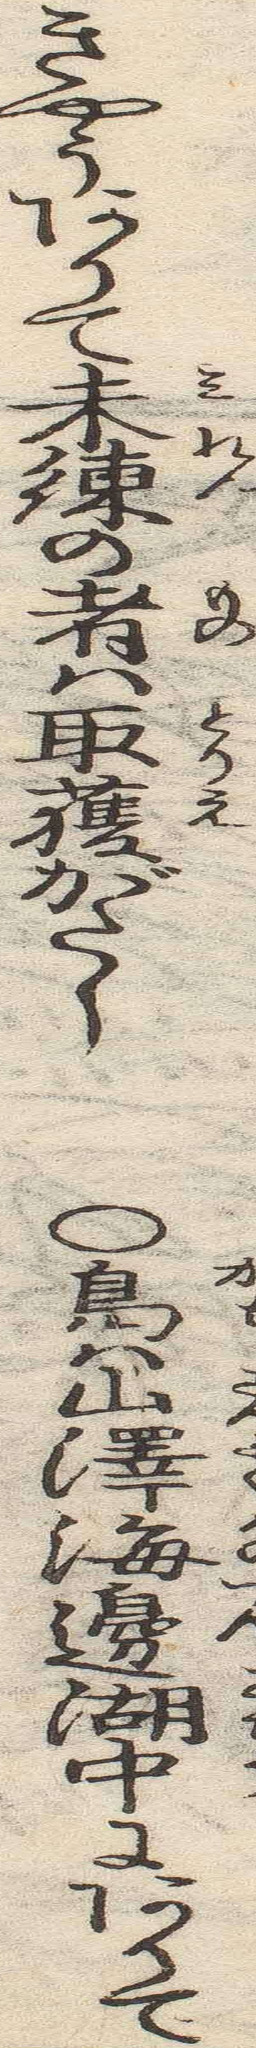きやうありて未練の者は取獲がたし○鳧は山沢海辺湖中にありて
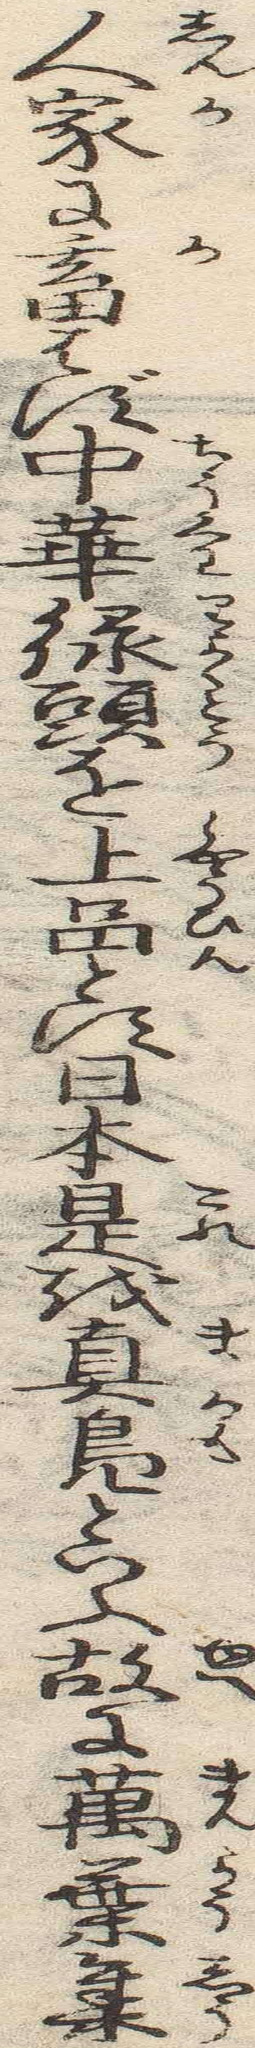人家に畜はず中華緑頭を上品とす日本是を真鳧といふ故に万葉集
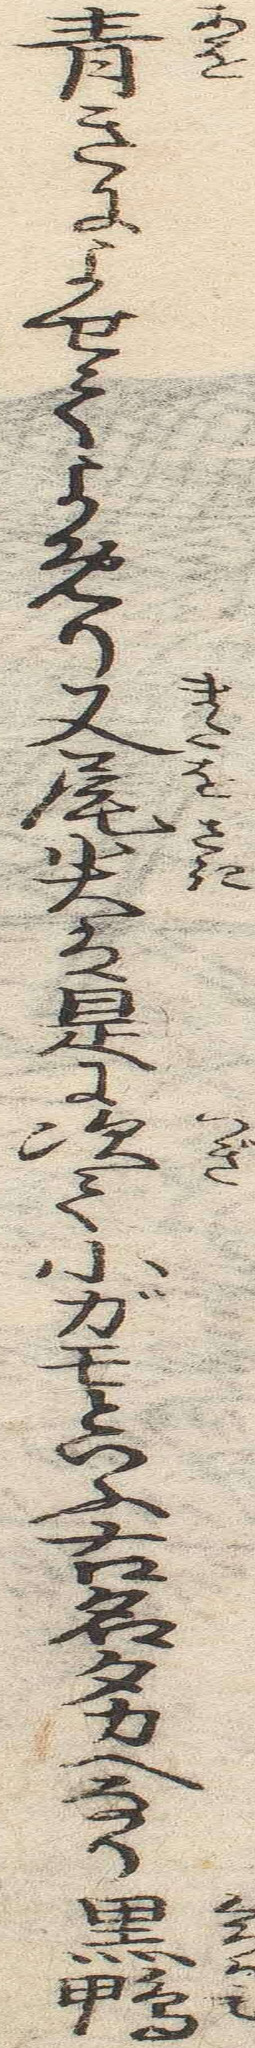青きによせてよめり又尾尖は是に次て小ガモといふ古名タカヘなり黒鴨
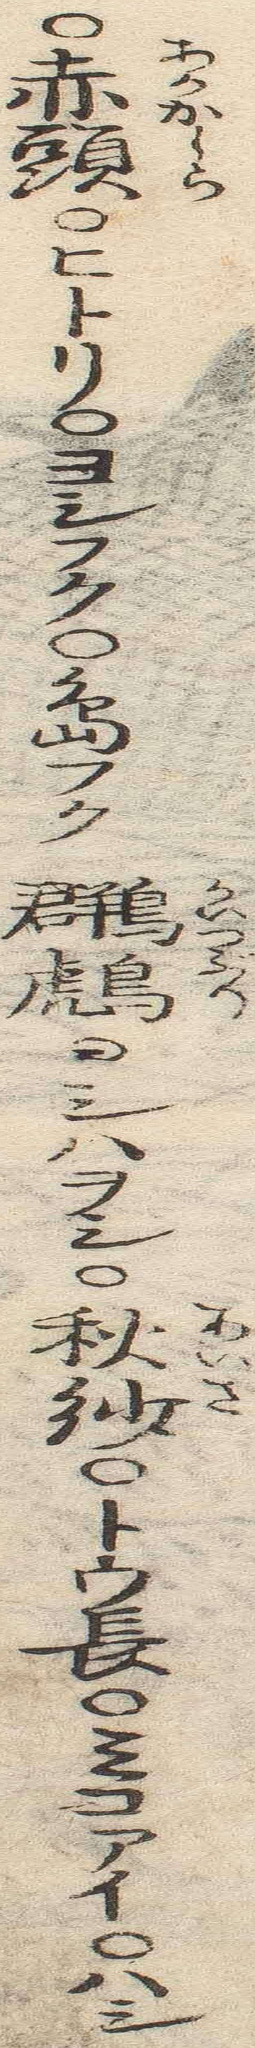◦赤頭◦ヒトリ◦ヨシフク◦島フク鸊鷉◦シハヲシ◦秋紗◦トウ長◦ミコアイ◦ハシ
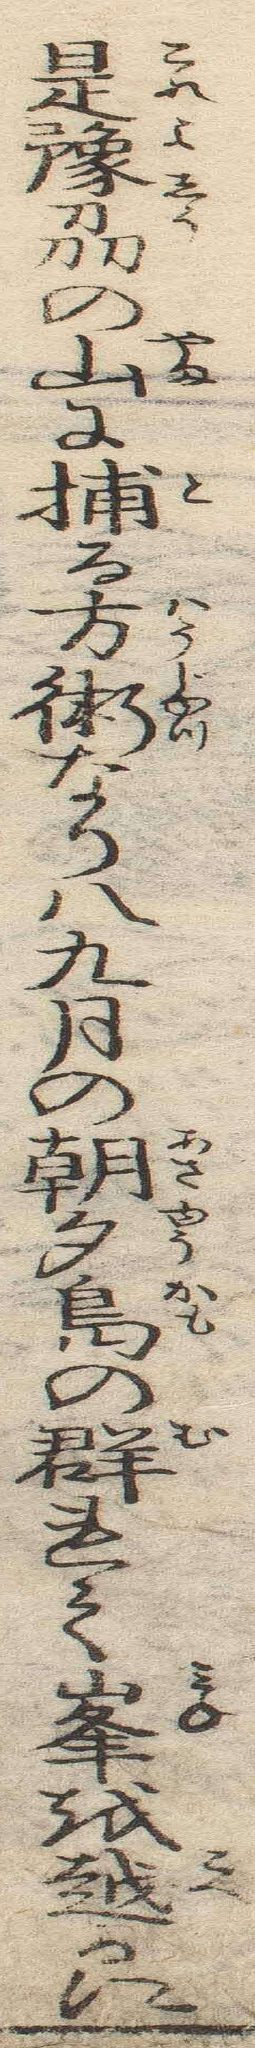是予州の山に捕る法術なり八九月の朝夕鳧の群れて峯を越るに
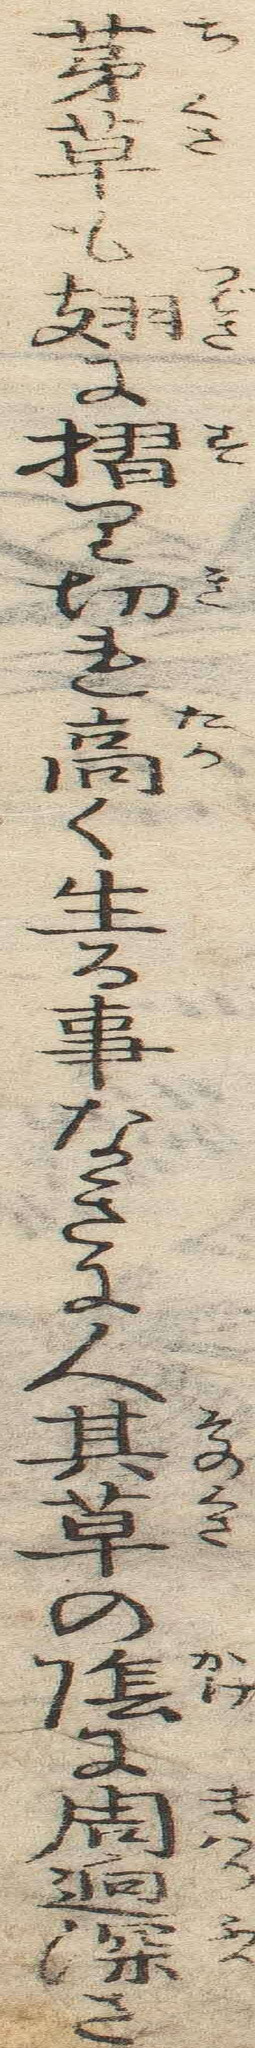茅草も翅に摺り切れ高く生る事なきに人其草の陰に周廻深さ
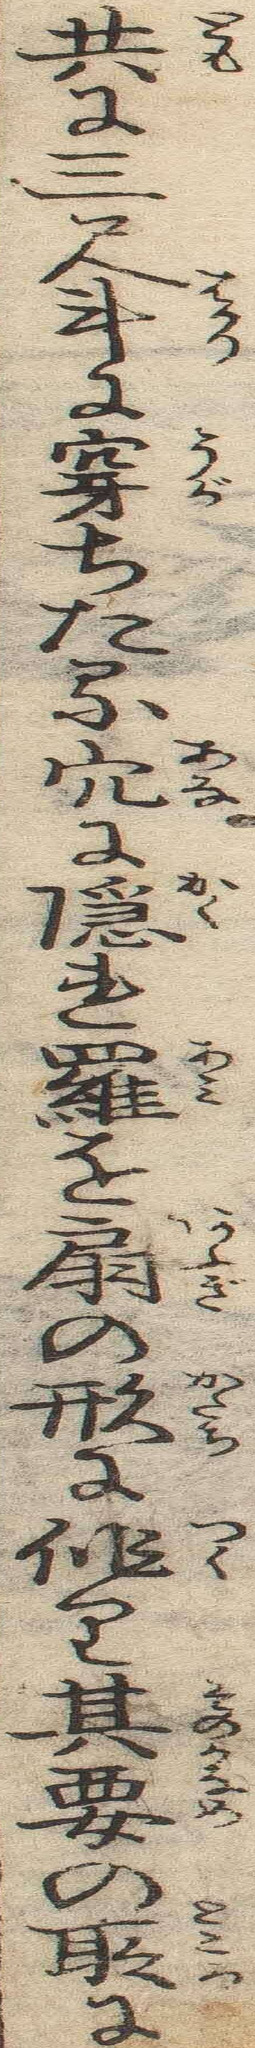共に三尺斗に穿ちたる穴に隠れ羅を扇の形に作り其要の所に

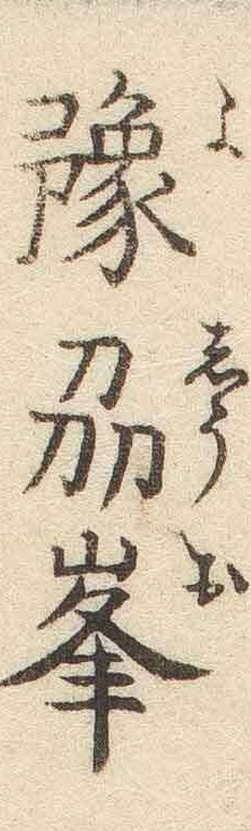予州峯

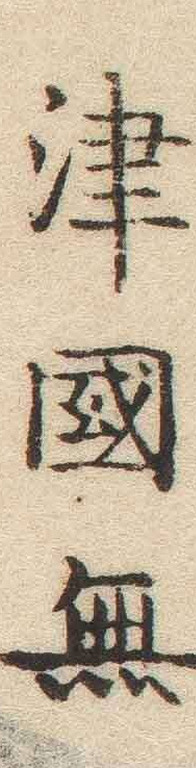津国無

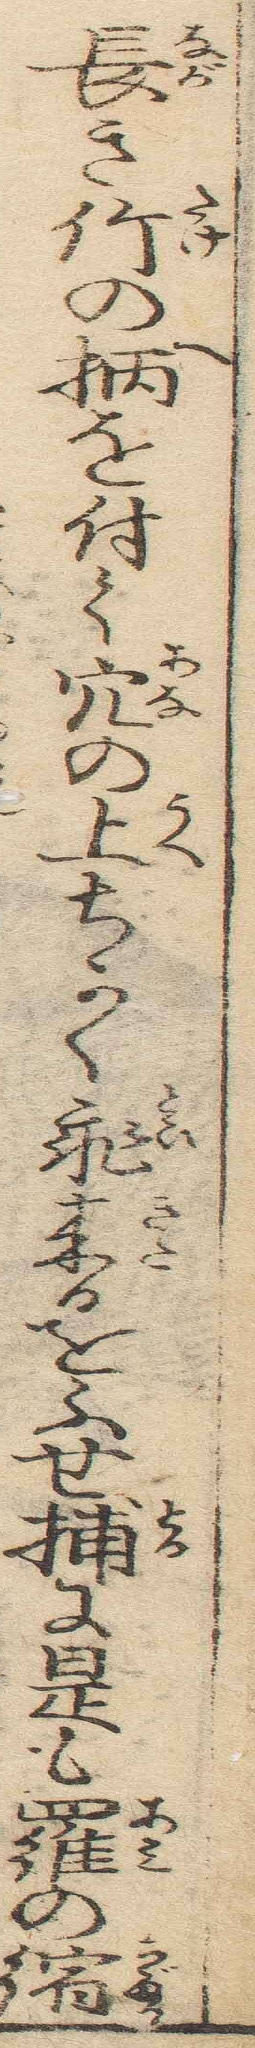長き竹の抦を付て穴の上ちかく飛来るをふせ捕に是も羅の縮
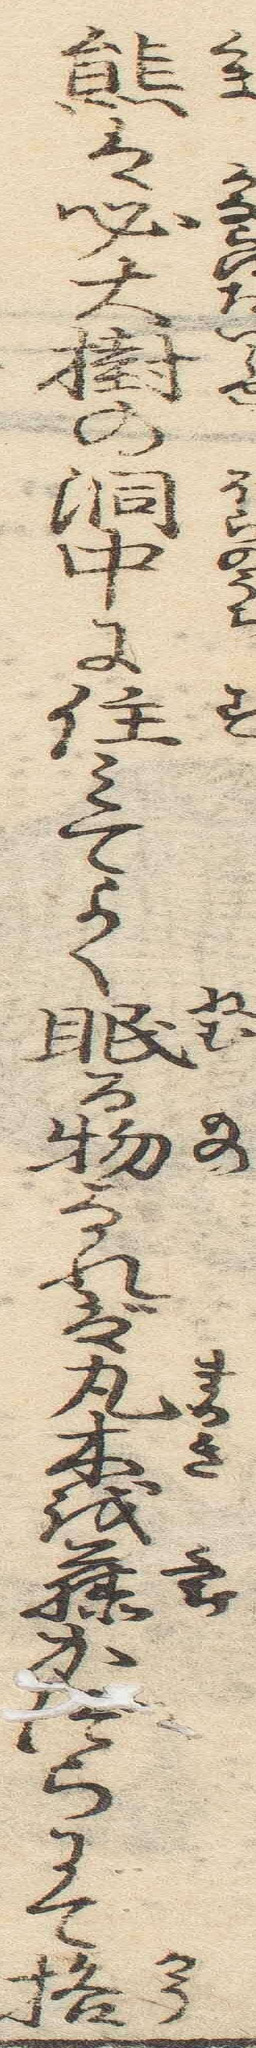熊は必大樹の洞中に住みてよく眠る物なれば丸木を藤かづらにて格
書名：日本山海名産図会
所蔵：東京学芸大学附属図書館 国文学研究資料館
